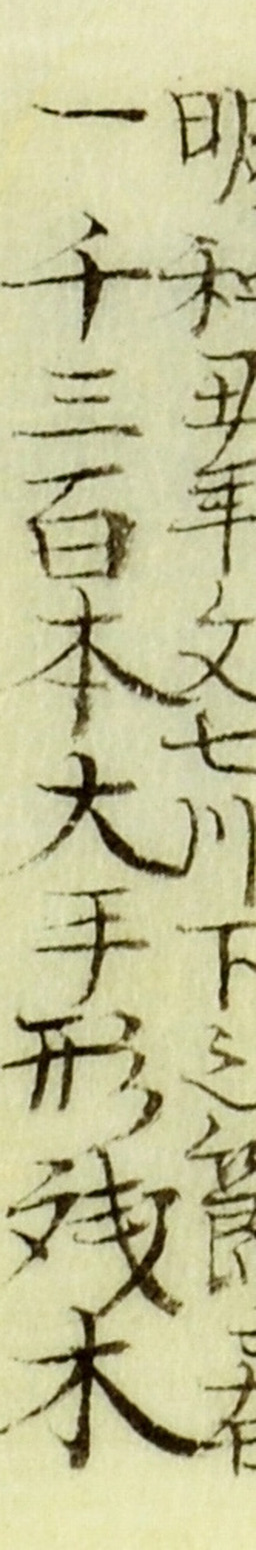一千三百本大手形残木
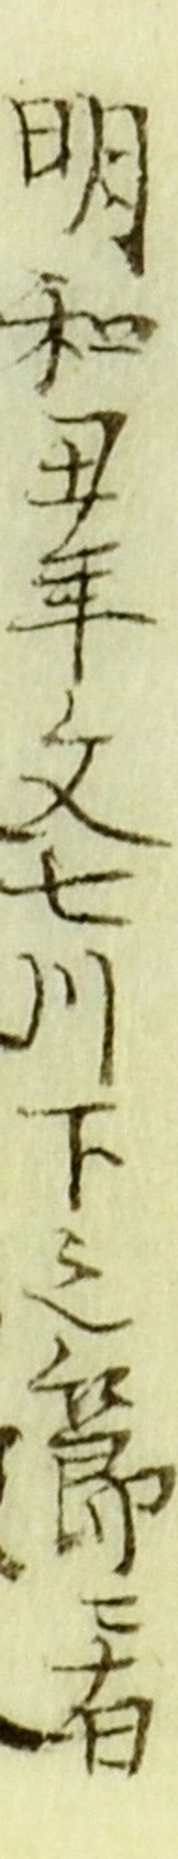明和丑年文七川下之節ニ有
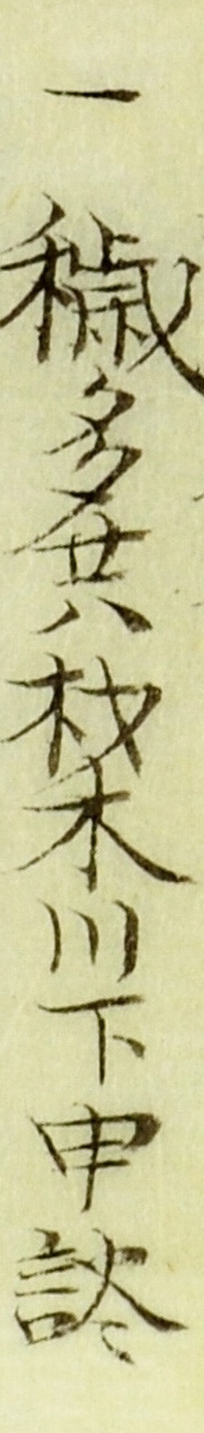一穢多共材木川下申談
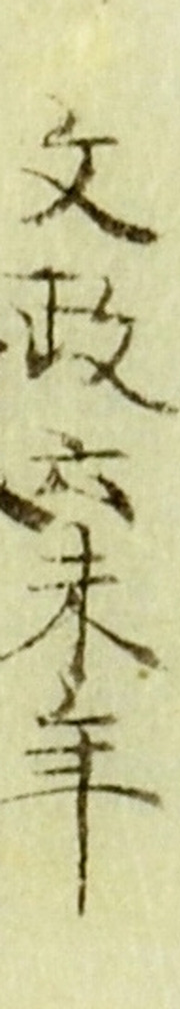文政六未年
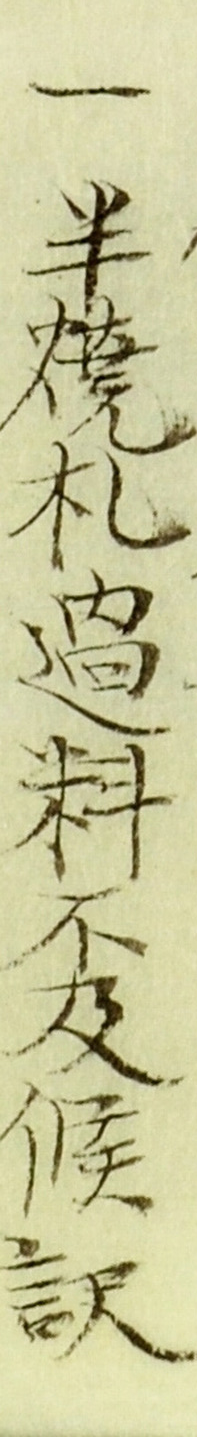一半焼札過料不及候訳
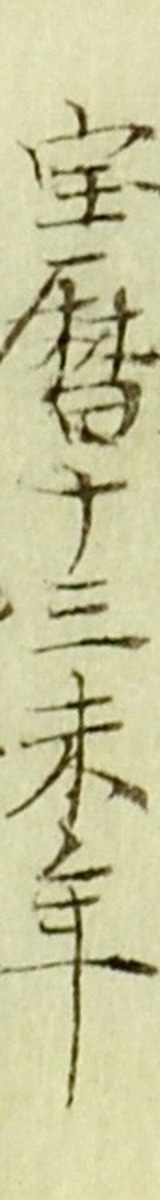宝暦十三未年
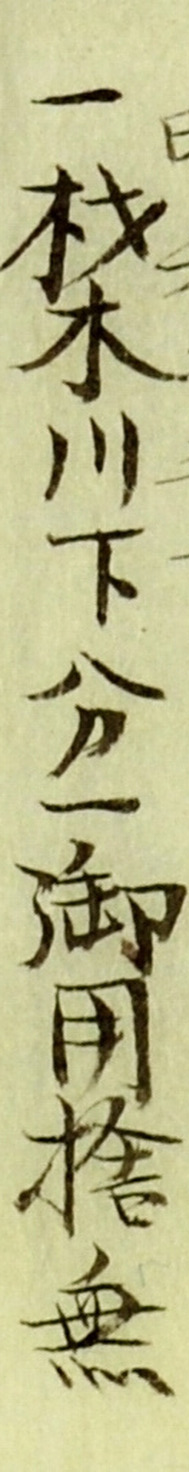一材木川下分一御用捨無
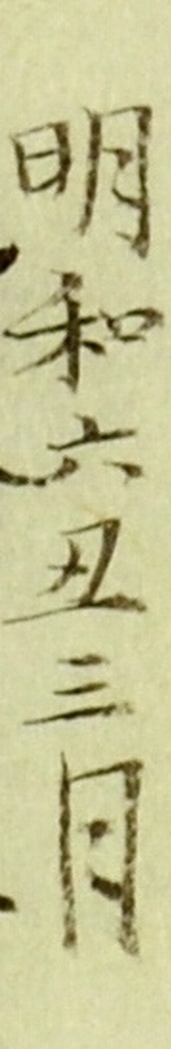明和六丑三月

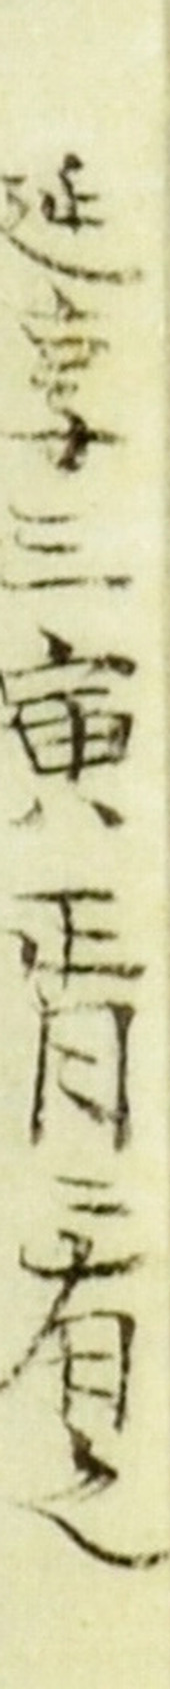延享三寅正月ニ有之
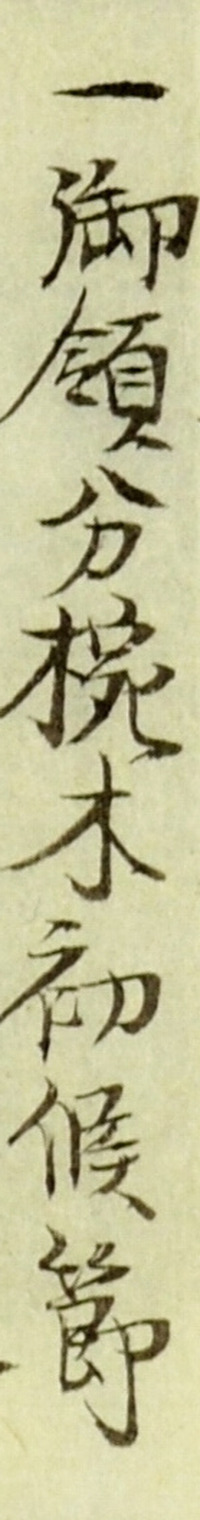一御領分椀木初候節
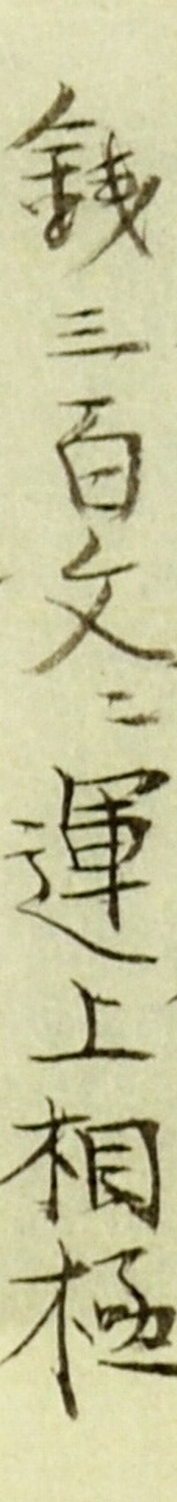銭三百文ニ運上相極
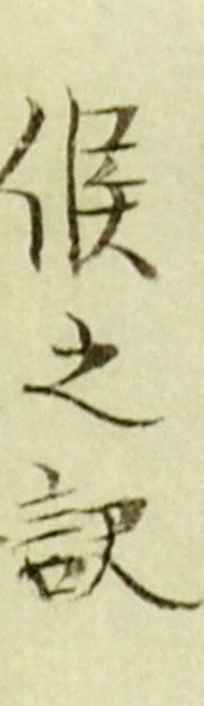候之訳
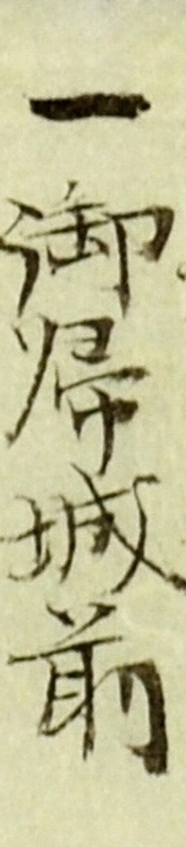一御帰城前
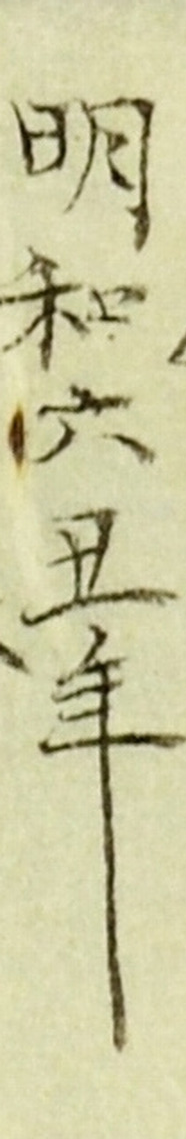明和六丑年
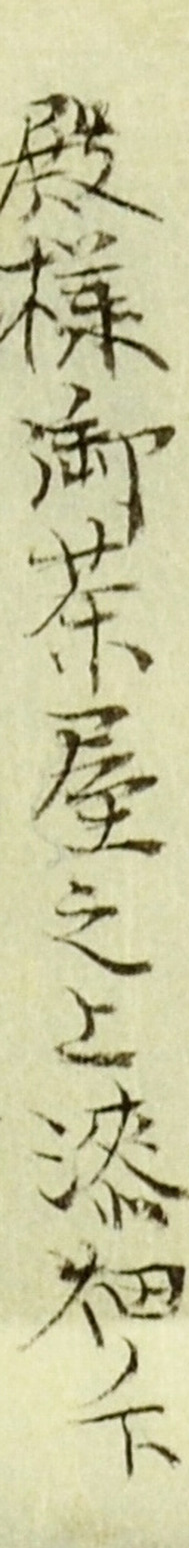殿様御茶屋之上漆畑ノ下
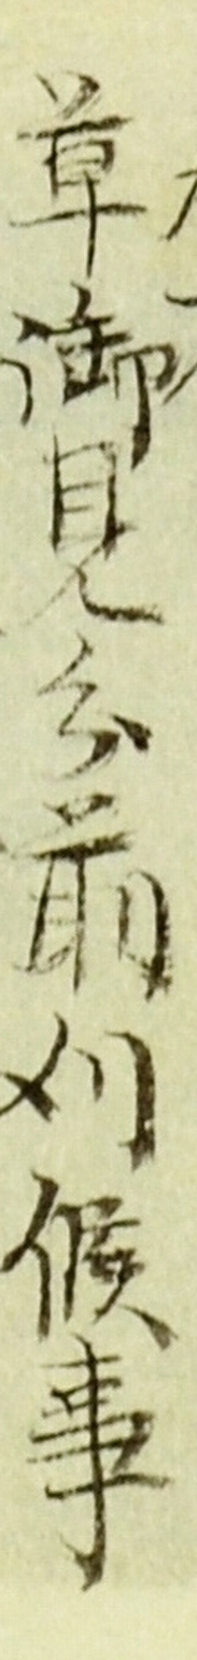草御見分前刈候事
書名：分一御定法
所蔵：伊那市立高遠町図書館・合同会社AMANE
